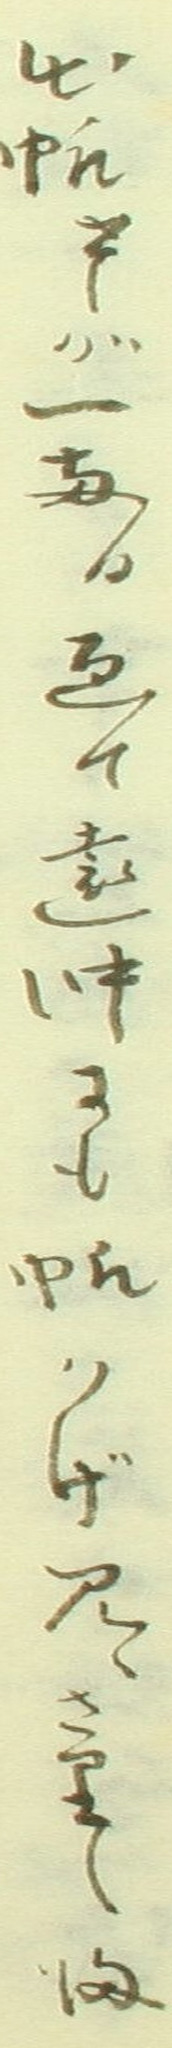出帆せしが一両日過て遠沖にも帆かげ見へさりし満
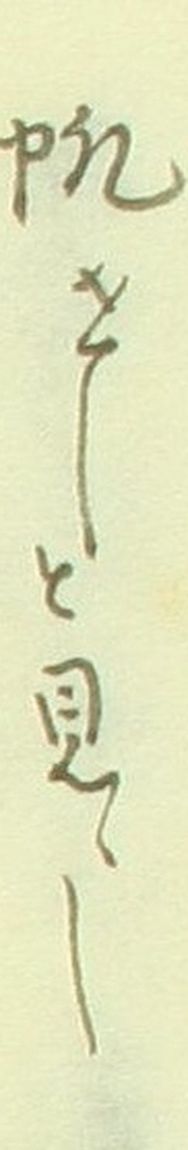帆せしと見へし
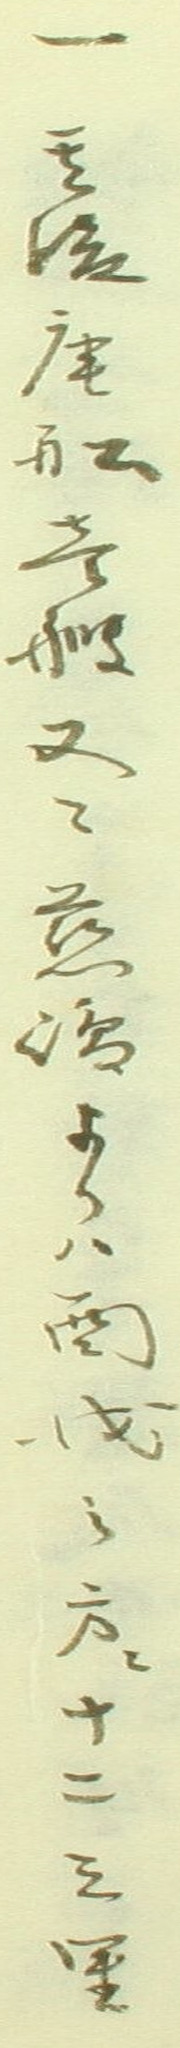一其後唐船壱艘又又慈嶋よりは酉戌之方に十二三里
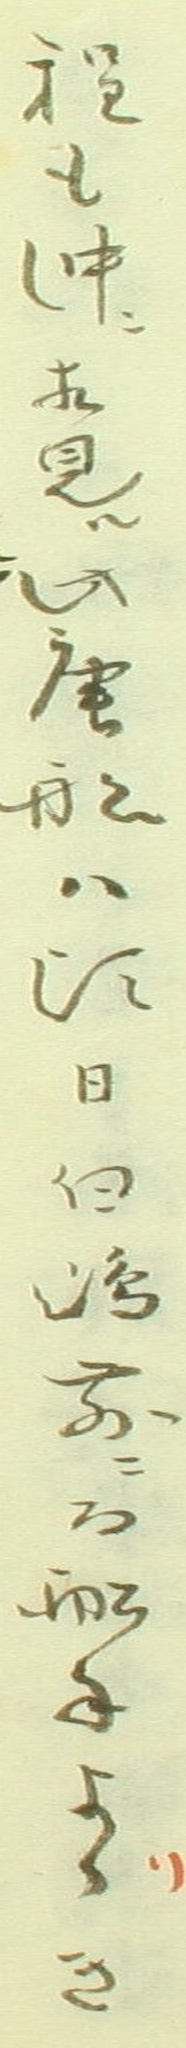程も沖に相見る此唐船は頃日白嶋前に而船手よりき
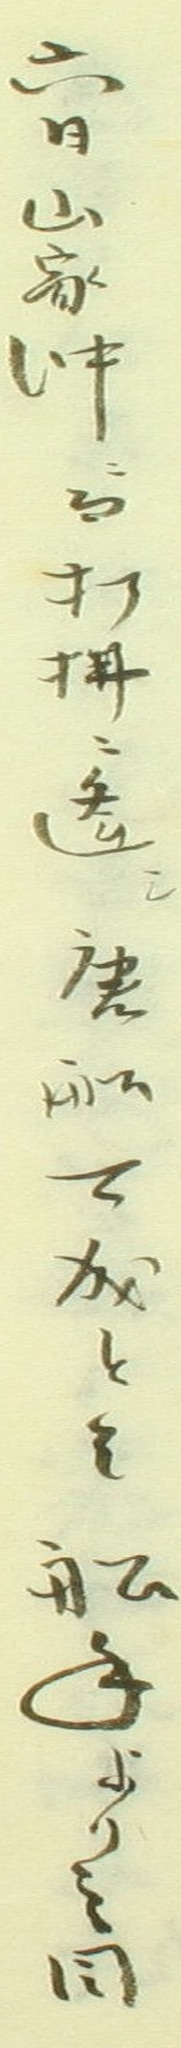六日山家沖に而打払に逢し唐船可成とそ船手より之目
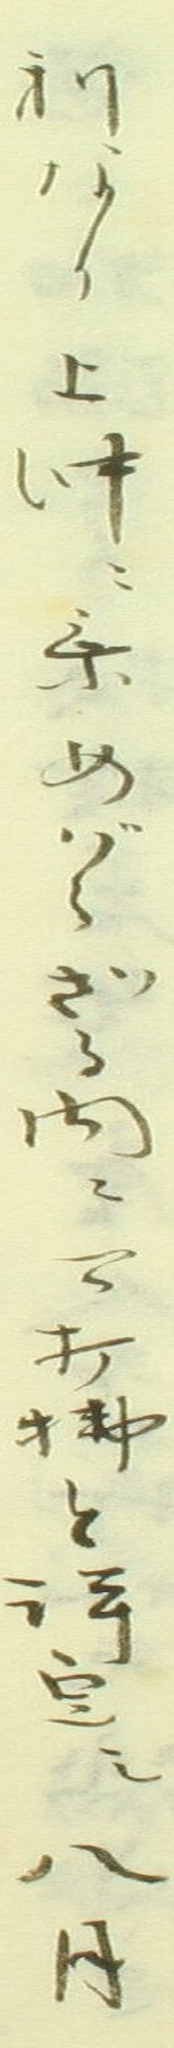利なり上沖に参めがらざる内に可打払と評定し八月
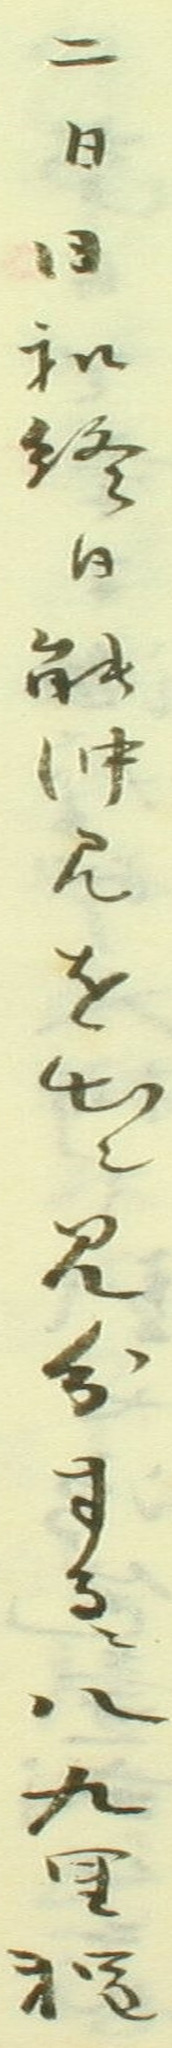二日日和終日能沖見を出し見分するに八九里程
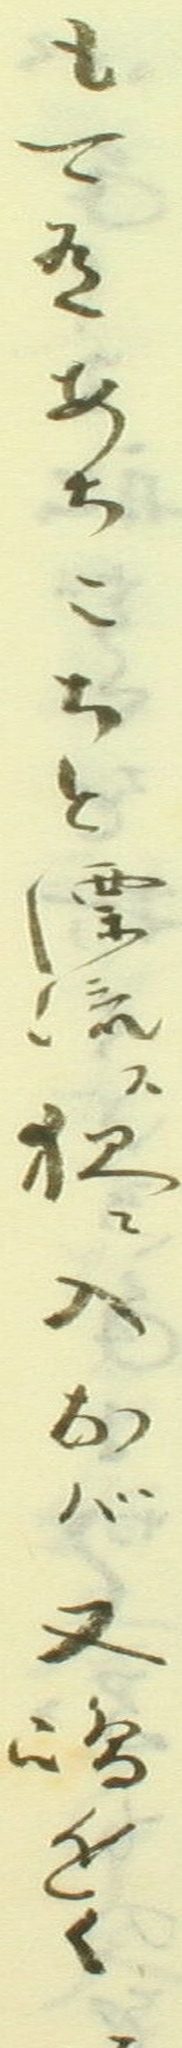も可有あちこちと漂流す夜に入なば又嶋近くに
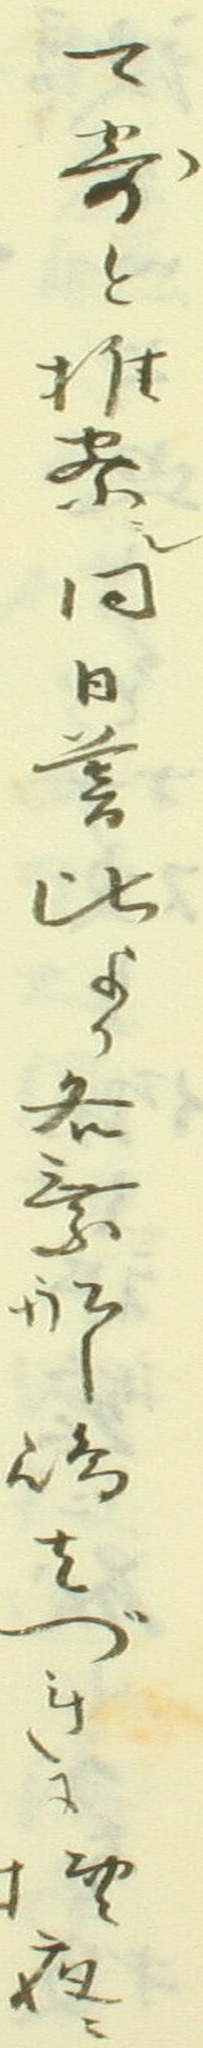て寄と推察し同日暮頃より各乗船し嶋はづれに？夜に
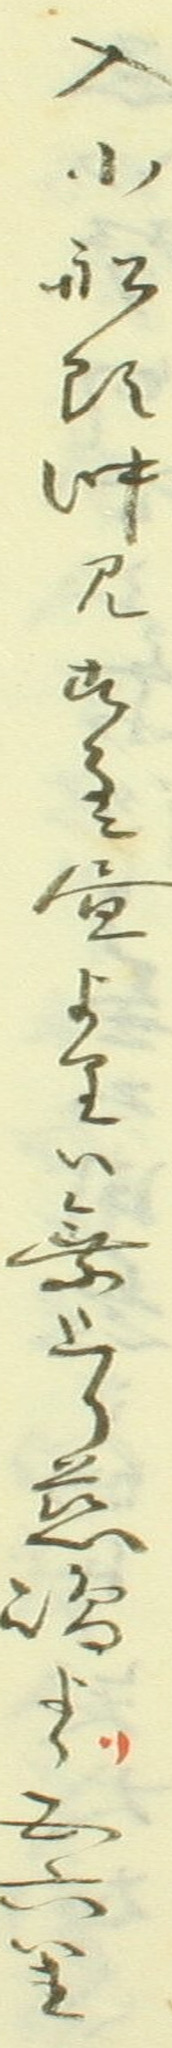入小船頭沖見するに昼よりは乗上り慈嶋より五六里
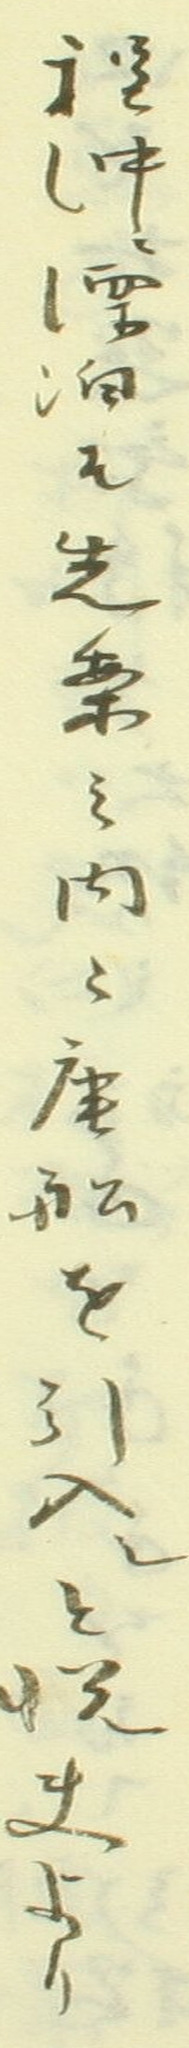程沖に漂泊す先案之内に唐船引入しと悦夫より
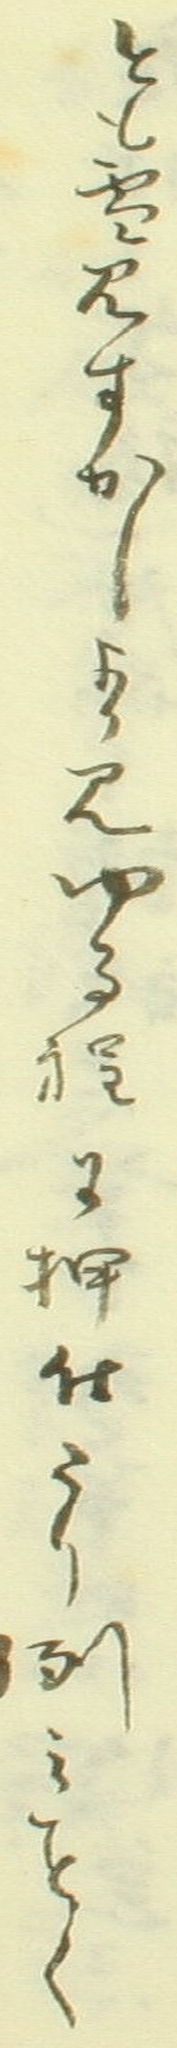とも雪見すかしより見ゆる程に押付たり例之ことく
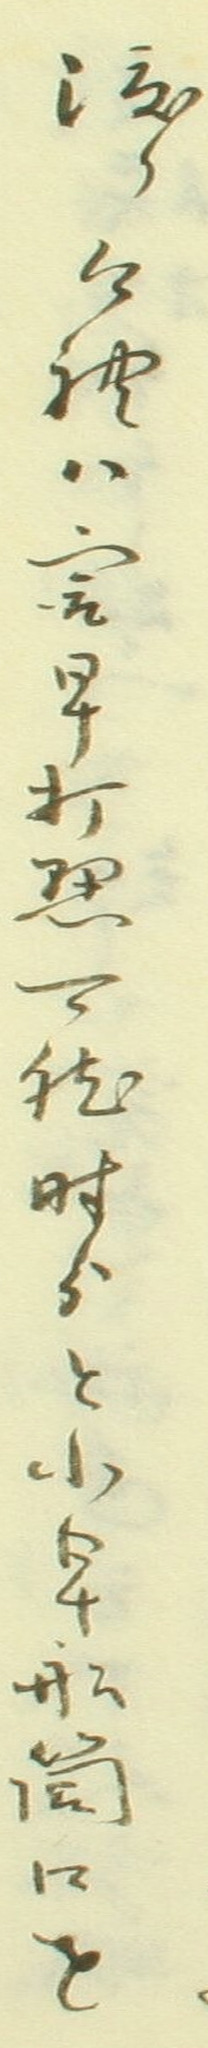渡りけれは最早打懸可然時分と小早船筒口を
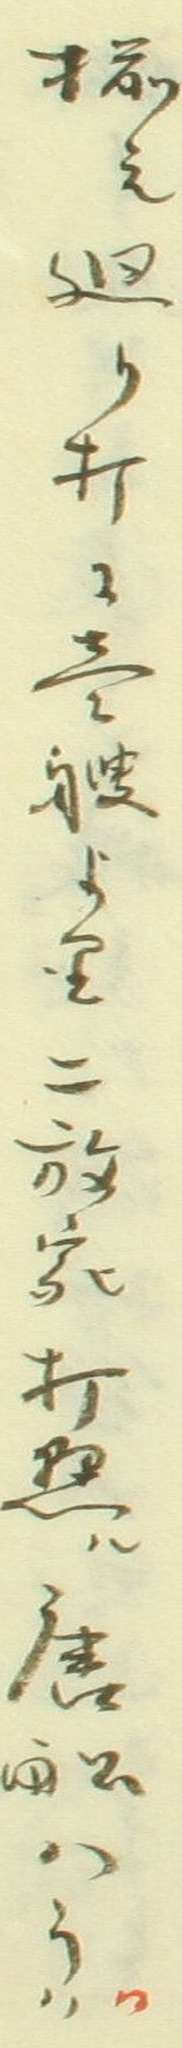揃え廻り打に壱艘より二放宛打懸る唐船はうか
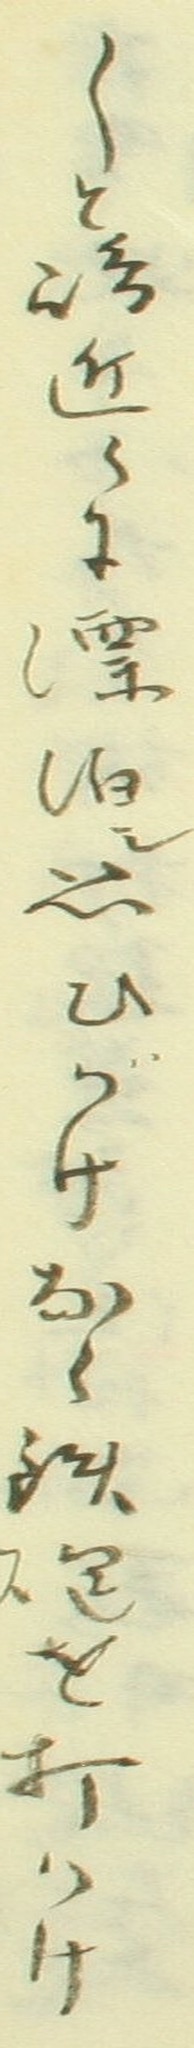うかと嶋近くに漂泊し思ひかけなく鉄砲を打かけ
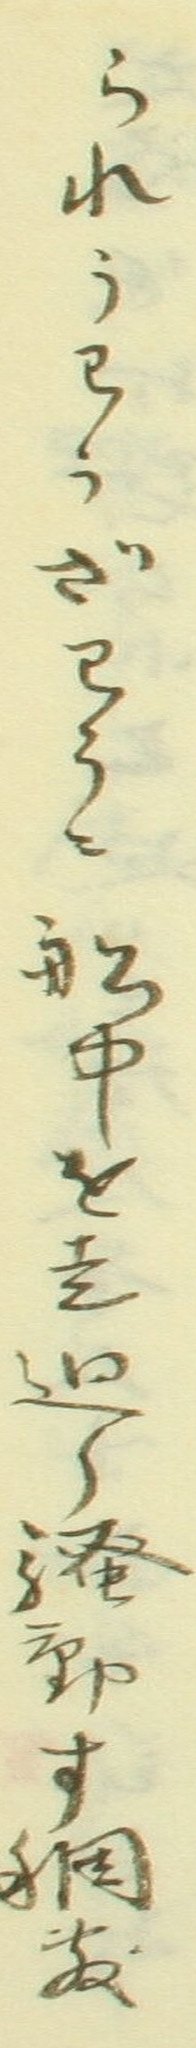られうわうざわうに船中を走廻り騒動す？敷
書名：唐船漂流記 三
